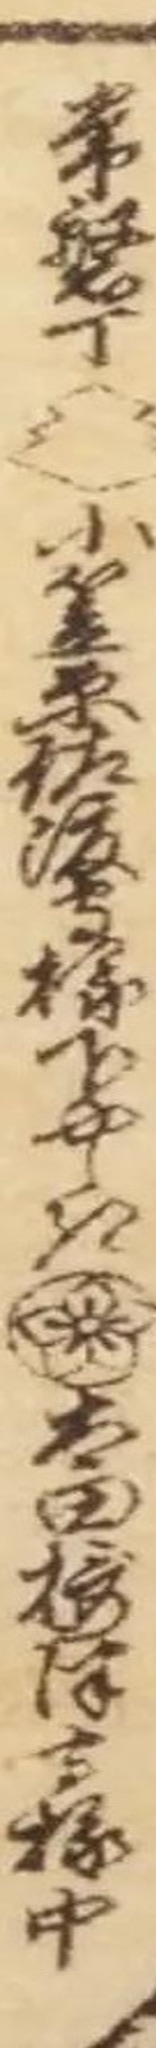常磐丁〇小笠原佐渡守様下やしき〇太田摂津守様中
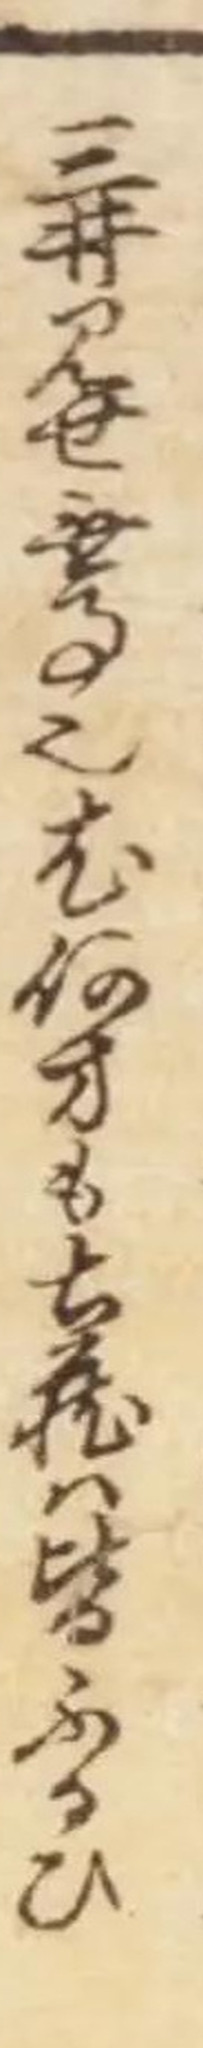三井見せ無事也尤何方も土蔵は皆ふるひ
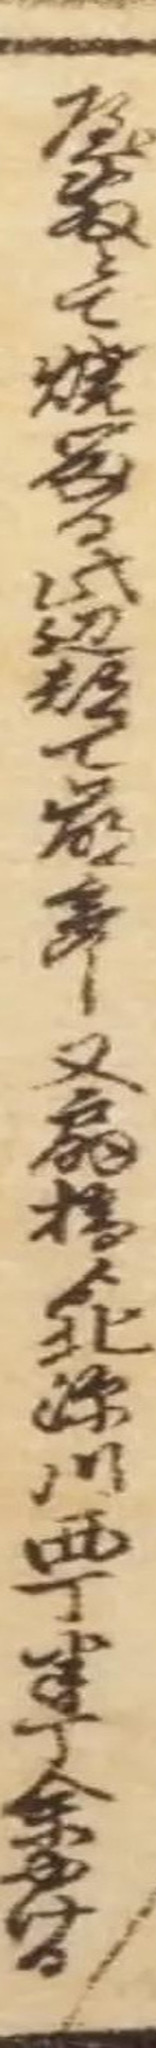屋敷にて焼留る此辺都て崩多し又扇橋より北源川西丁半丁余やける
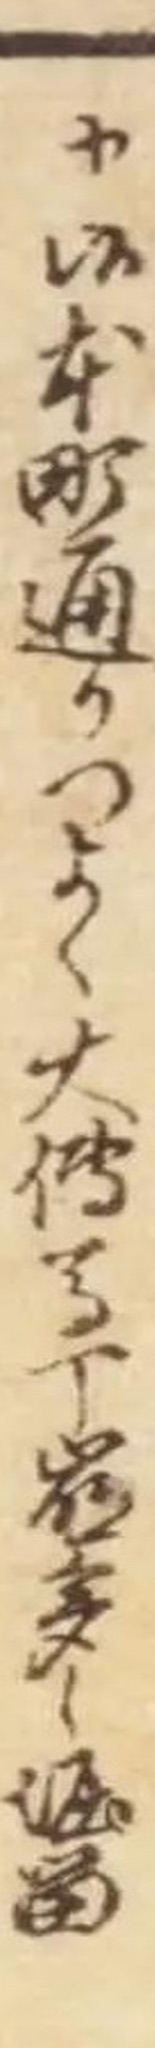申候本町通りつよく大傳馬丁崩多し堀留
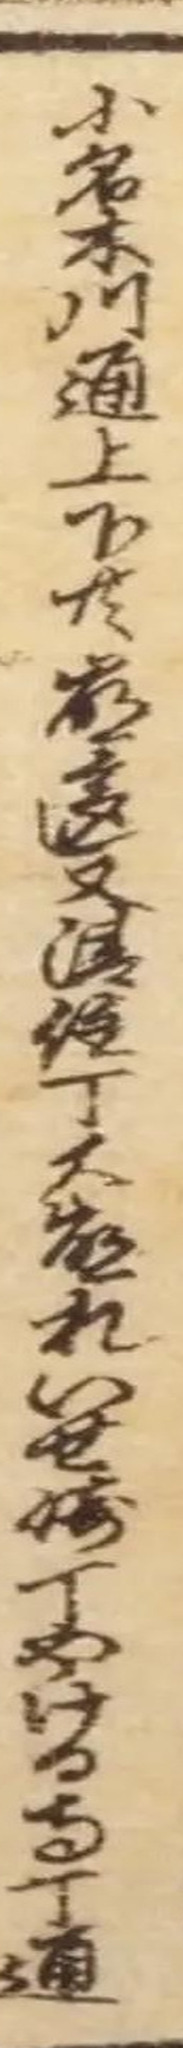小名木川通上下共崩多し又清住丁大崩れいせ崎丁やける寺丁通
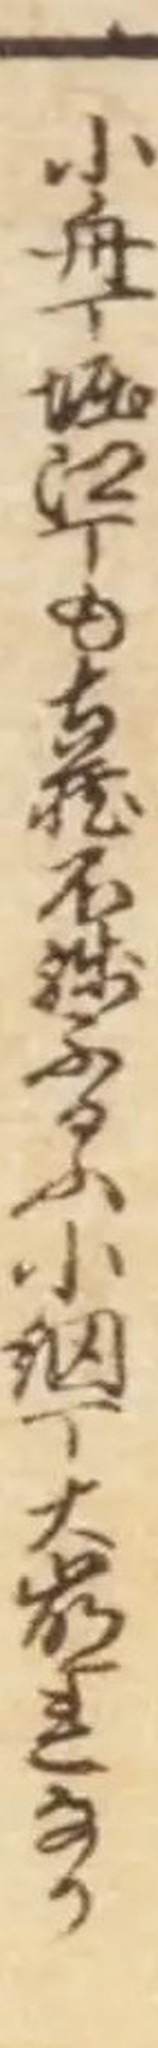小舟丁堀江丁も土蔵不残ふるふ小網丁大崩れなり
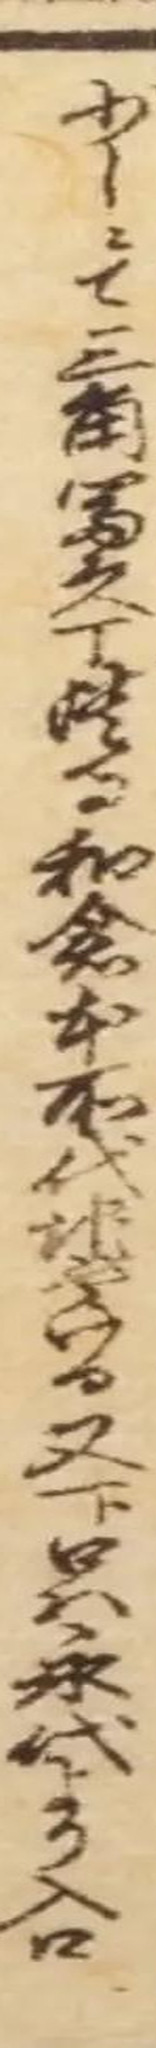少しにて三角富久丁潰る和倉本所代地やける又一ト口は永代より入口
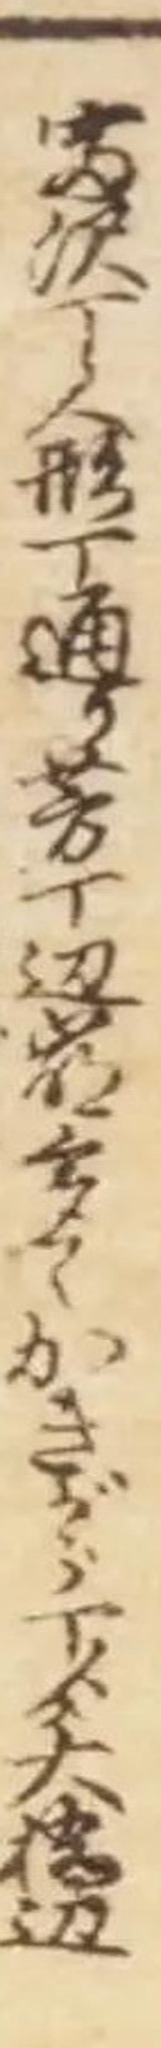富沢丁人形丁通り芳丁辺崩多くかきがら丁より大橋辺
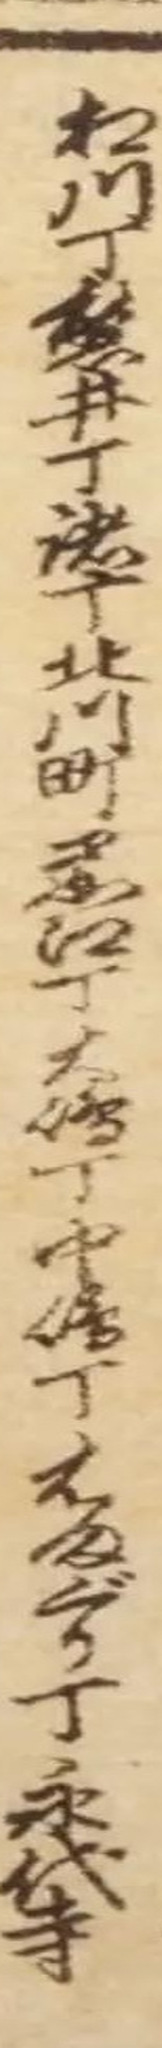松川丁熊井丁諸丁北川町黒江丁大島丁中島丁はまぐり丁永代寺
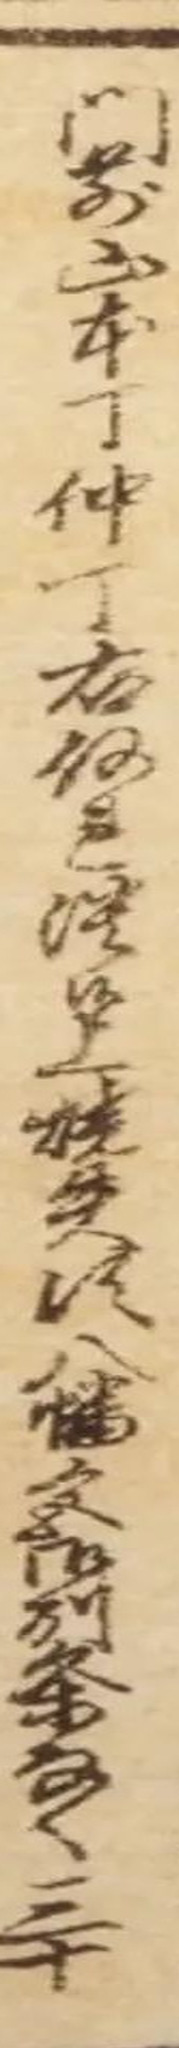門前山本丁仲丁右何れ潰候上焼失す八幡宮御別条なく三十
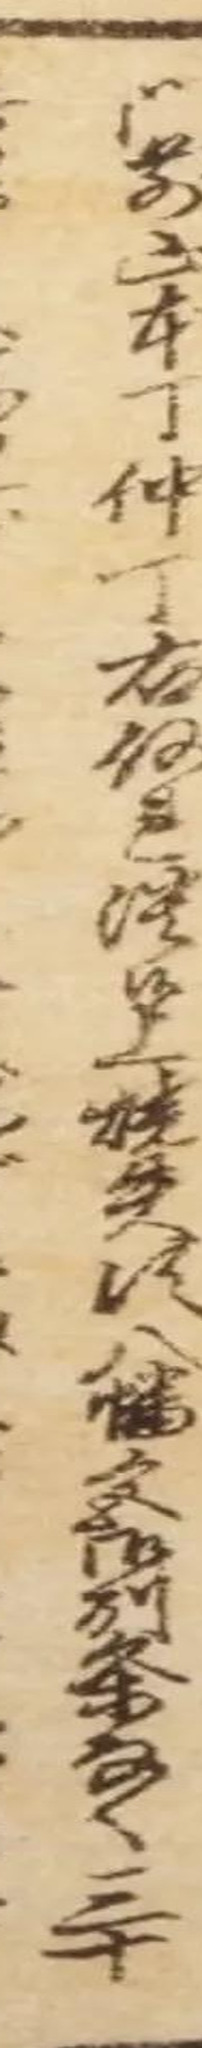門前山本丁仲丁右何れ潰候上焼失す八幡宮御別条なく三十
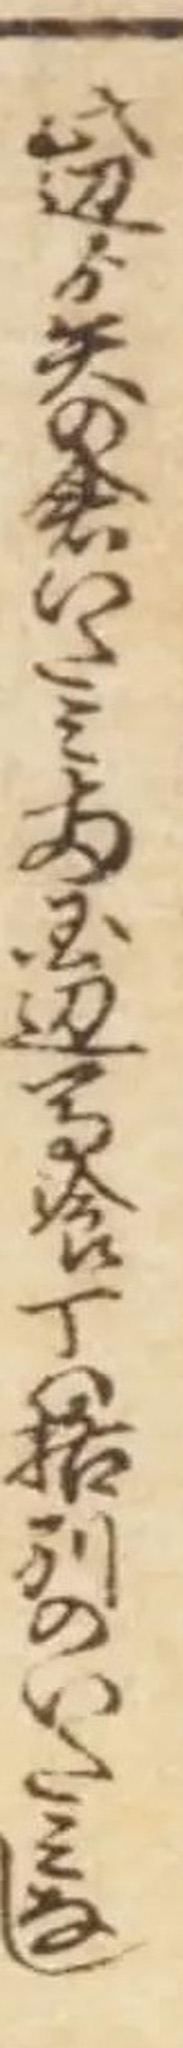此辺ゟ矢の倉いたみ両国辺馬喰丁は格別のいたみなし
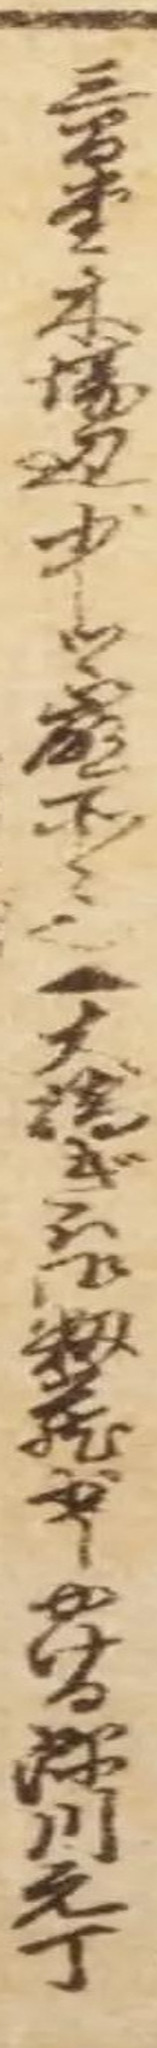三間堂木場辺少しツヽ崩所〻也▲大橋ぎは御籾蔵少しやける深川元丁
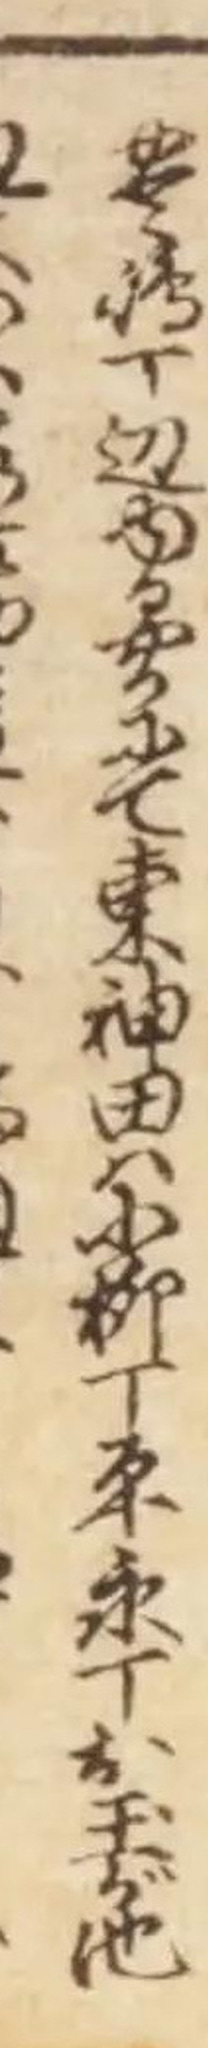豊嶋丁辺ゆるやかにて東神田は小柳丁平永丁お玉が池
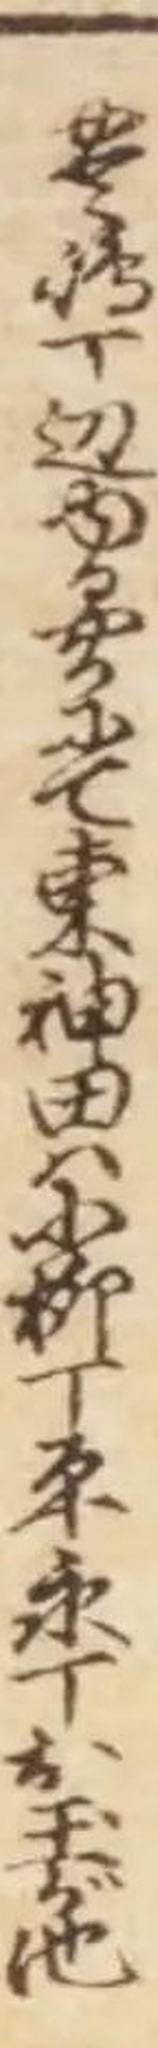豊嶋丁辺ゆるやかにて東神田は小柳丁平永丁お玉が池
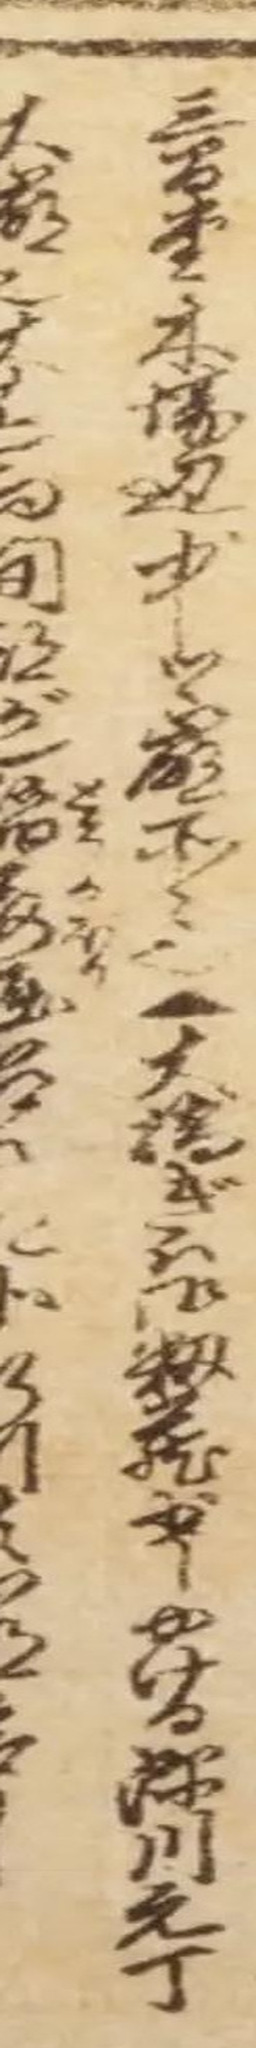大崩也大はし向間部がし稲荷堀箱さき北新川共崩多し
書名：御江戸関八州大地震出火巨細記
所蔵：国立国会図書館 National Diet Library, JAPAN
